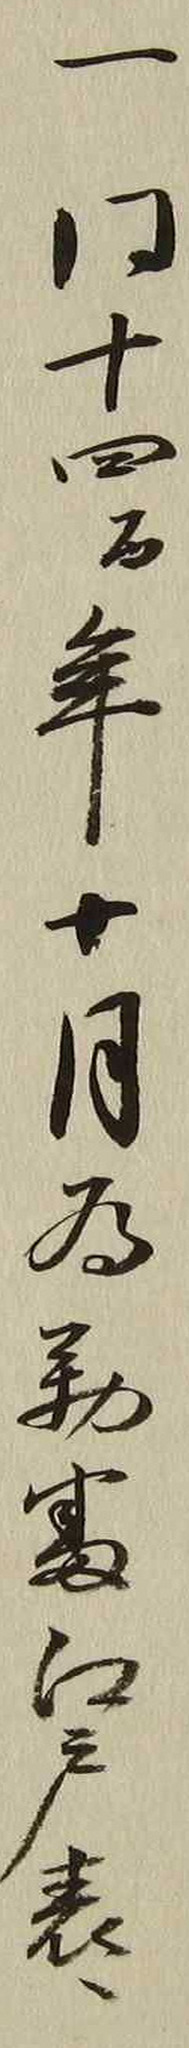一同十四酉年十月為勤番江戸表へ
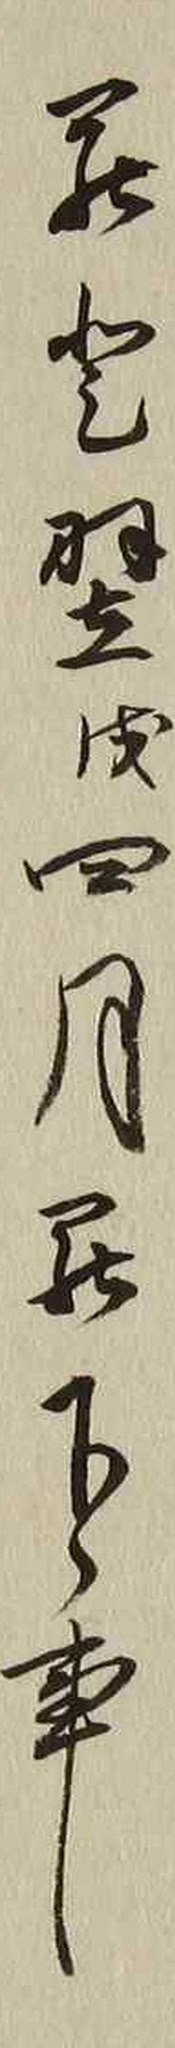罷登翌戌四月罷下候事
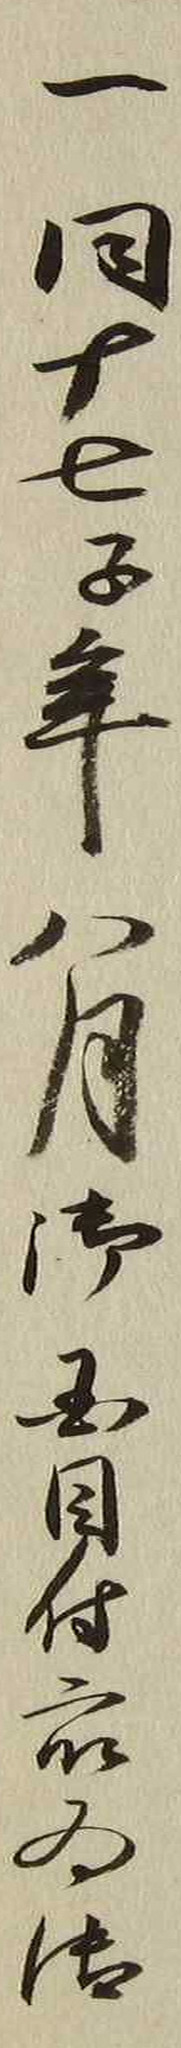一同十七子年八月御国目付衆為御
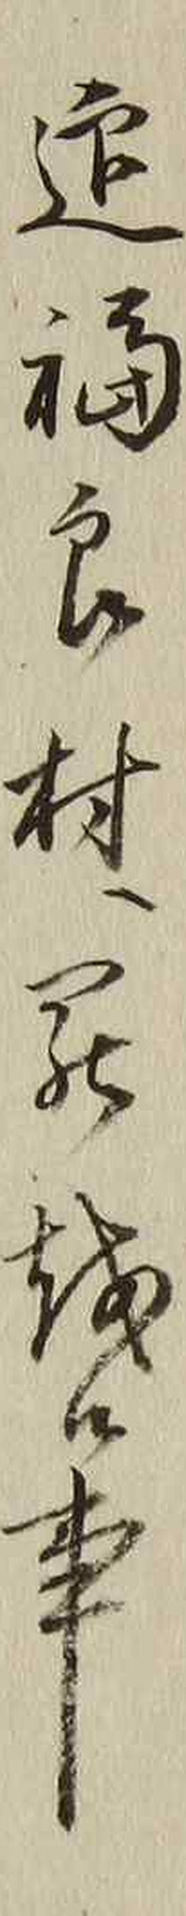迎福良村へ罷越候事
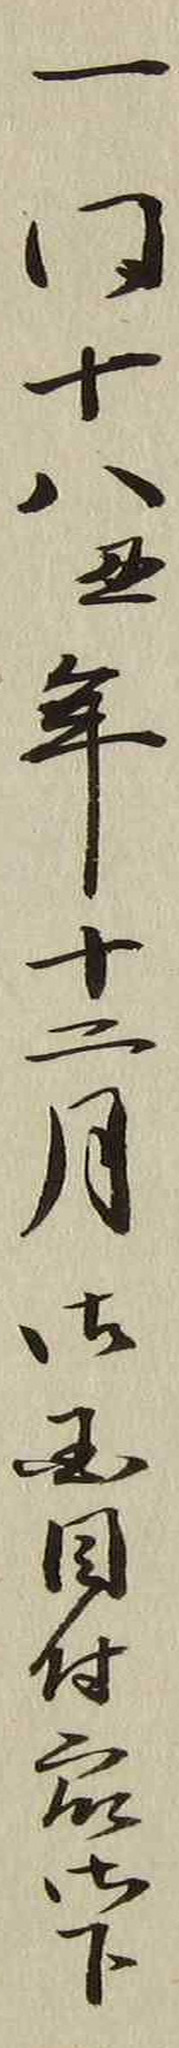一同十八丑年十二月御国目付衆御下
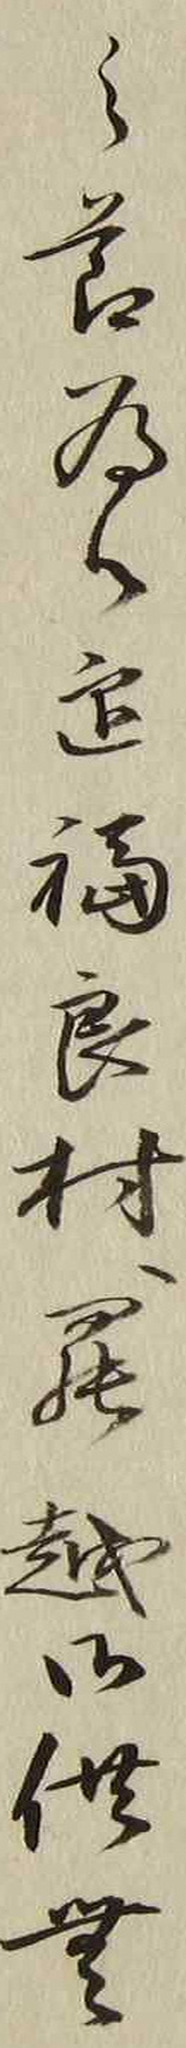之節為御迎福良村へ罷越御供無
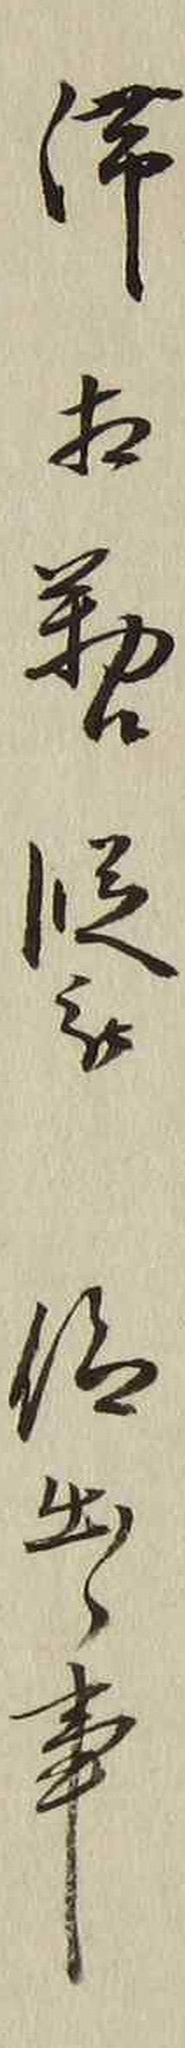滞相勤候段被仰出候事
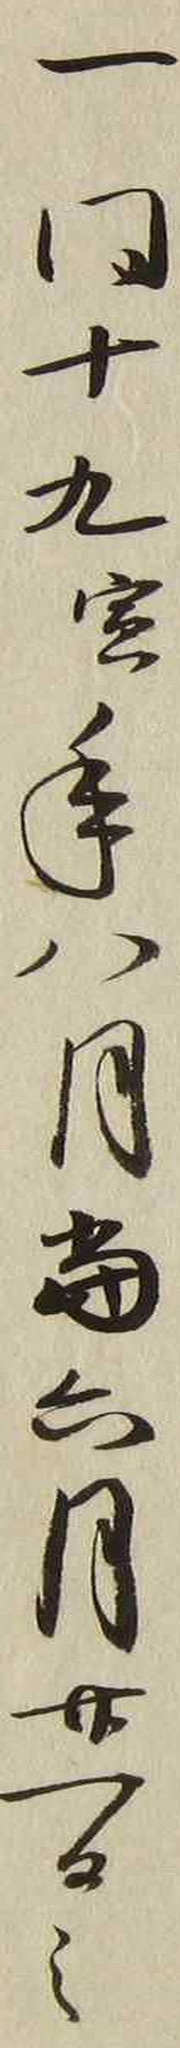一同十九寅年八月当六月廿一日之
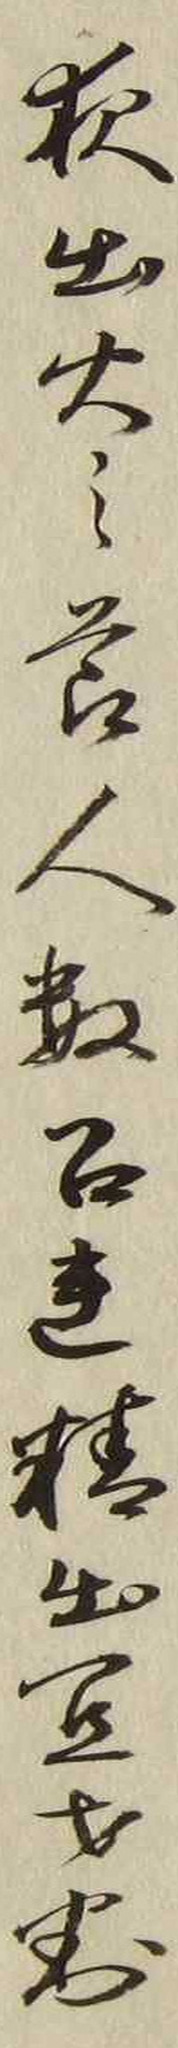夜出火之節人数召連精出宜才到
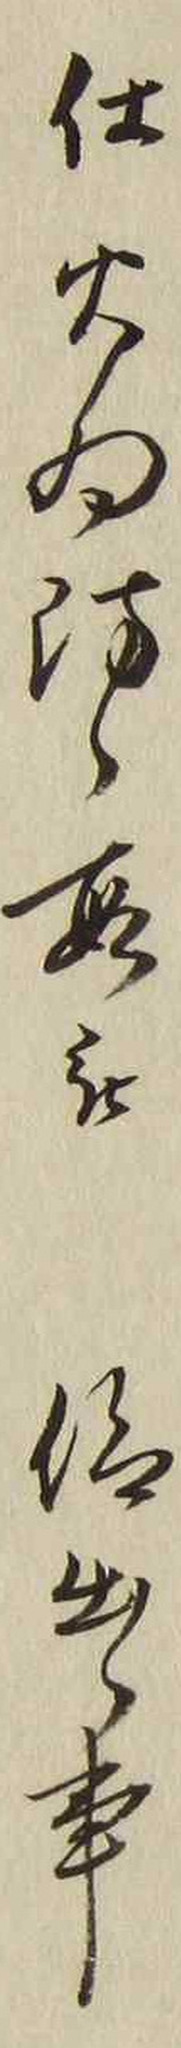仕火為防候段被仰出候事

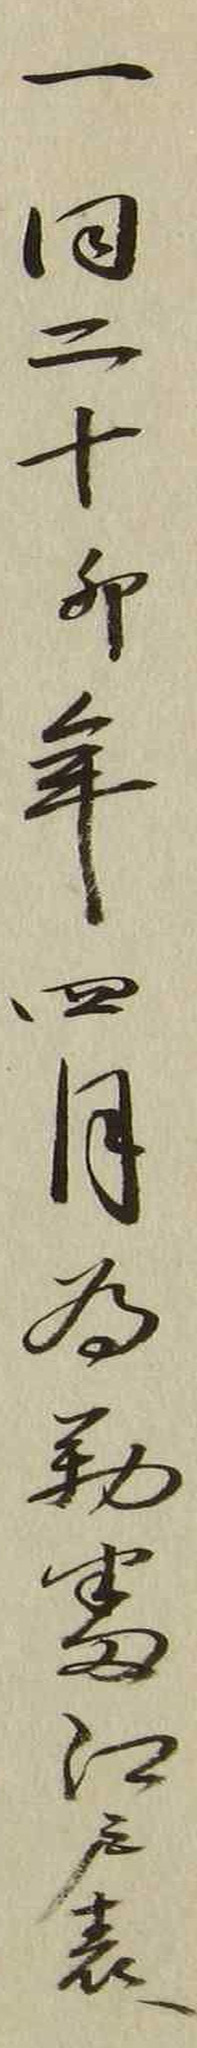一同二十卯年四月為勤番江戸表へ
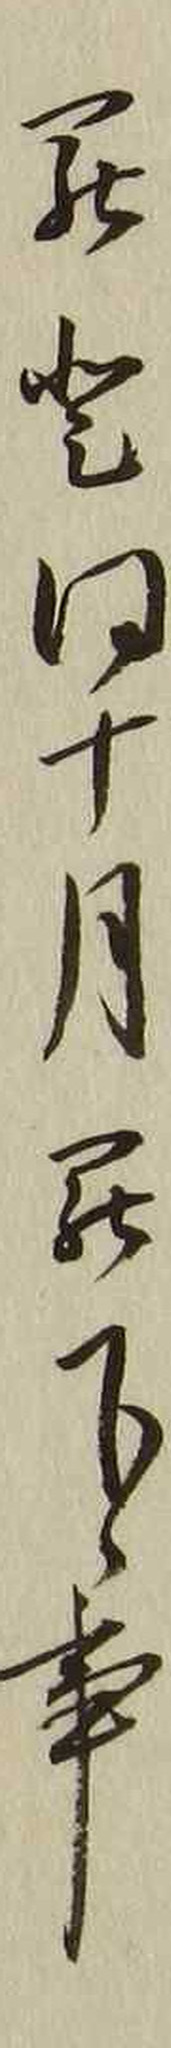罷登同十月罷下候事
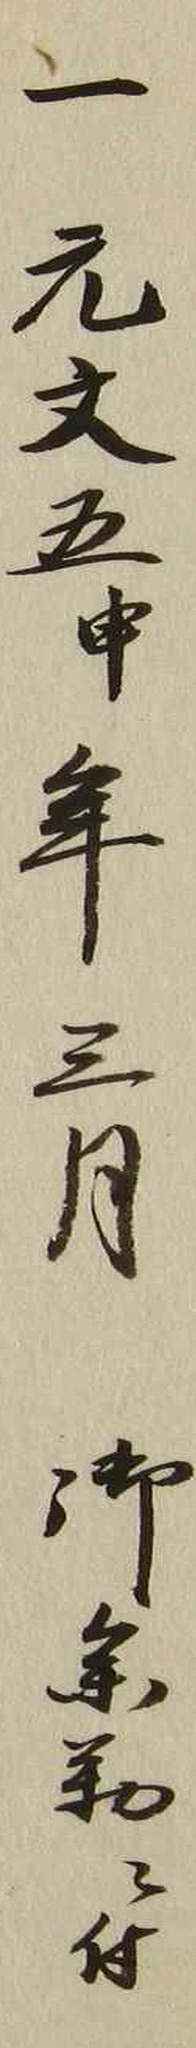一元文五申年三月御参勤ニ付
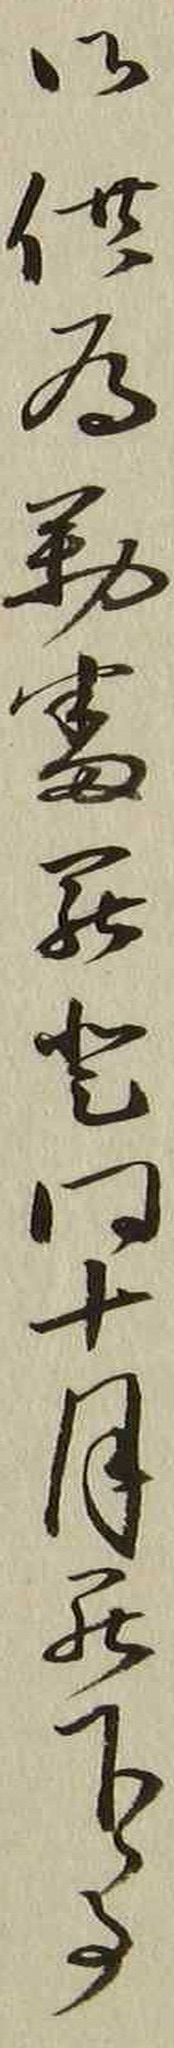御供為勤番罷登同十月罷下候事
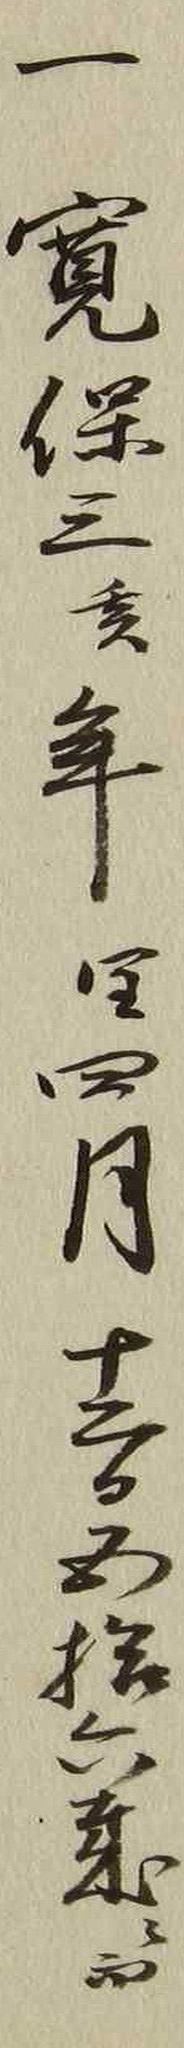一寛保三亥年閏四月十二日五拾六歳ニ而
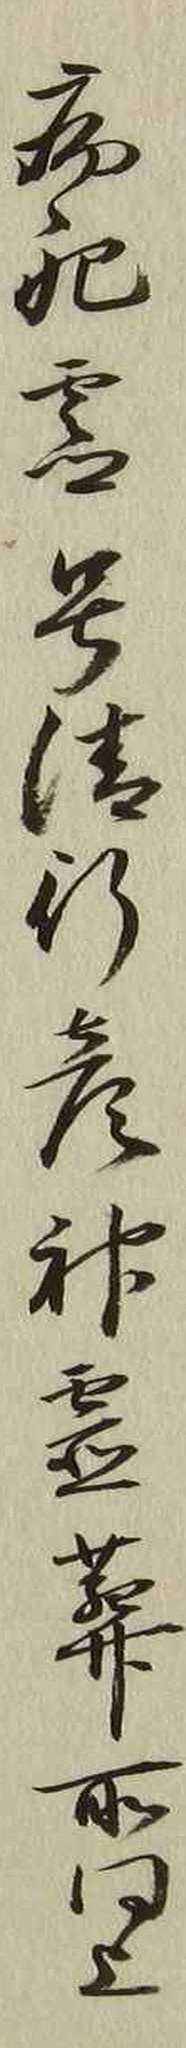病死霊号清行彦神霊葬所同上
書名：諸士系譜　巻之69　を之部3
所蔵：会津若松市立会津図書館
